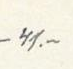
41
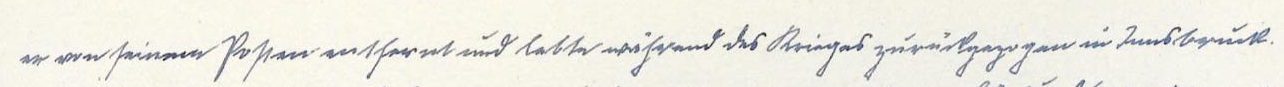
er von seinem Posten entfernt und lebte während des Krieges zurückgezogen in Innsbruck.
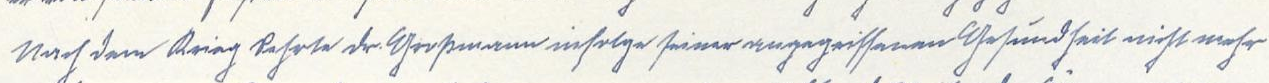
Nach dem Krieg kehrte Dr. Großmann infolge seiner angegriffenen Gesundheit nicht mehr
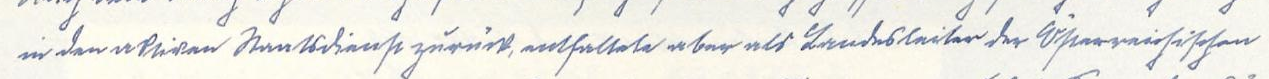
in den aktiven Staatsdienst zurück, entfaltete aber alles Landesleiter der Österreichischen
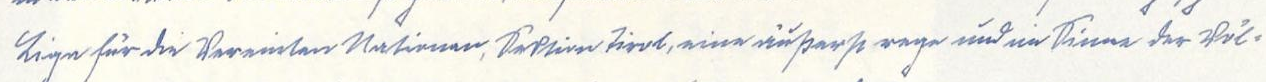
Liga für die Vereinten Nationen, Sektion Tirol eine äußerst rege und im Sinne der Völ-
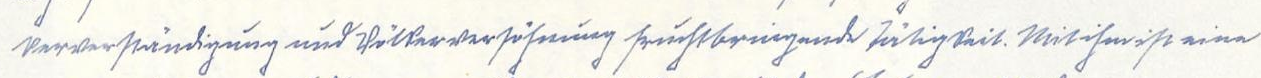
kerverständigung und Völkerversöhnung fruchtbringende Tätigkeit. Mit ihm ist eine
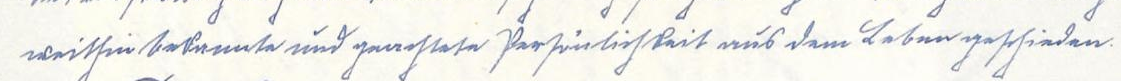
weithin bekannte und geachtete Persönlichkeit aus dem Leben geschieden.
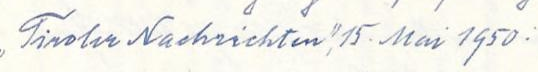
„Tiroler Nachrichten“, 15. Mai 1950:
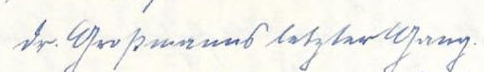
Dr. Großmanns letzter Gang
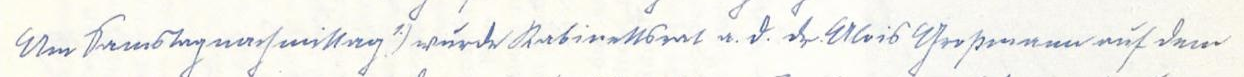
Am Samstagnachmittag 1) wurde Kabinettsrat a. D. Dr. Alois Großmann auf dem
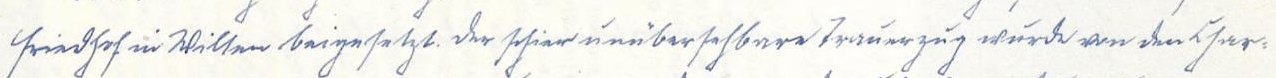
Friedhof in Wilten beigesetzt. Der schier unübersehbare Trauerzug wurde von den Char-
